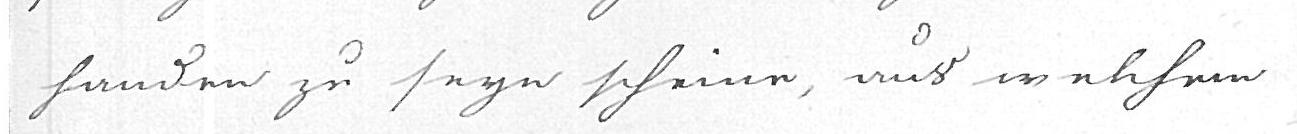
handen zu seyn scheine, aus welchem
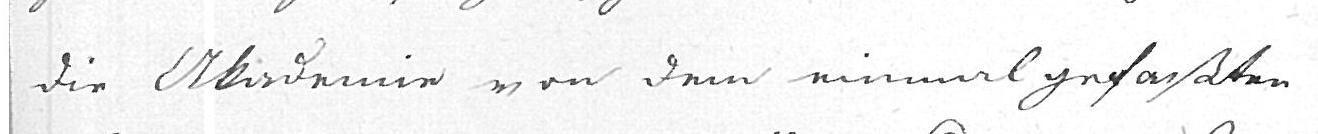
die Akademie von dem einmal gefaßten
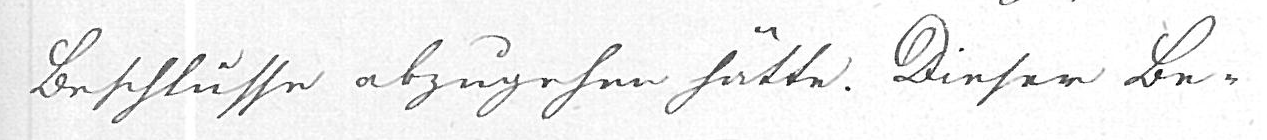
Beschlusse abzugehen hätte. Dieser Be-
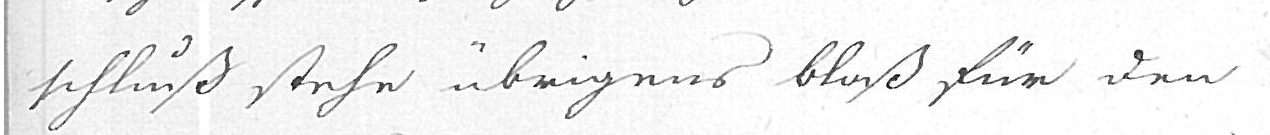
schluß stehe übrigens bloß für den
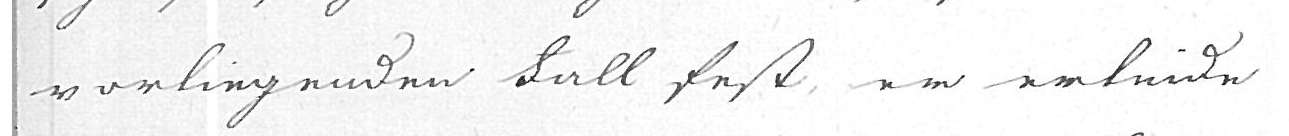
vorliegenden Fall fest, er erleide
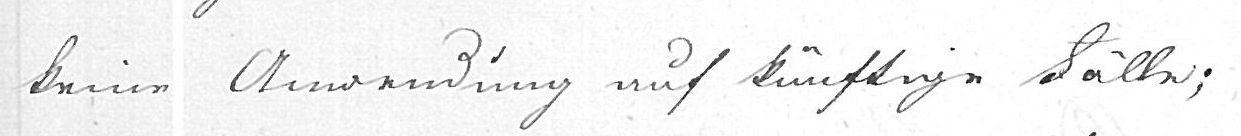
keine Anwendung auf künftige Fälle,
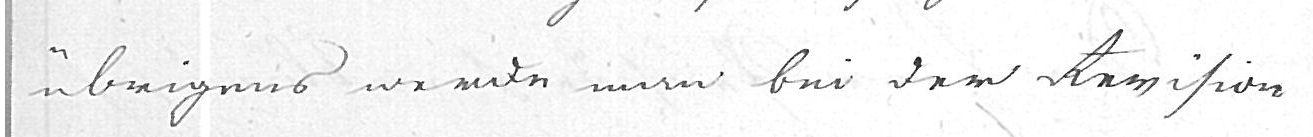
übrigens werde man bei der Revision
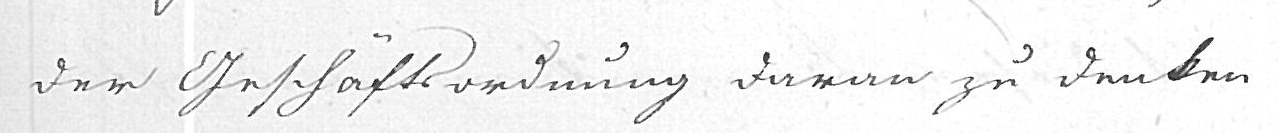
der Geschäftsordnung daran zu denken
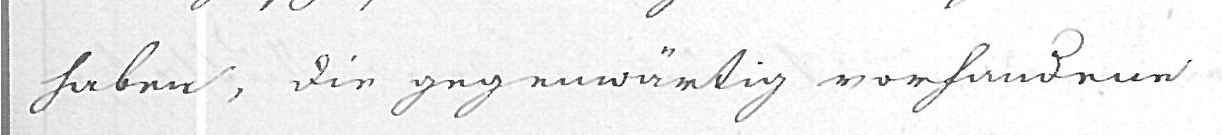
haben, die gegenwärtig vorhandene
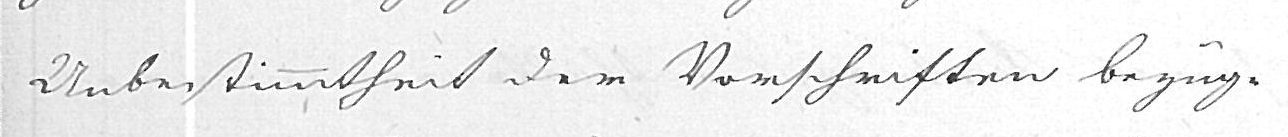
Unbestimmtheit der Vorschriften bezüg-
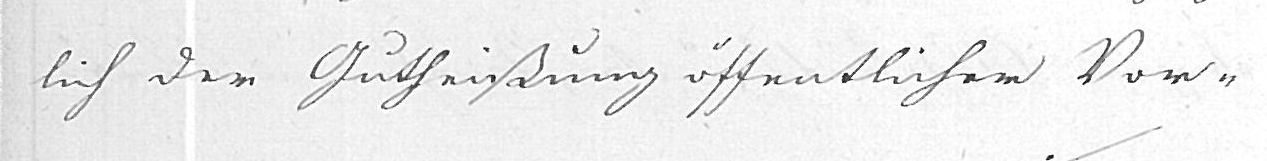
lich der Gutheißung öffentlicher Vor-
